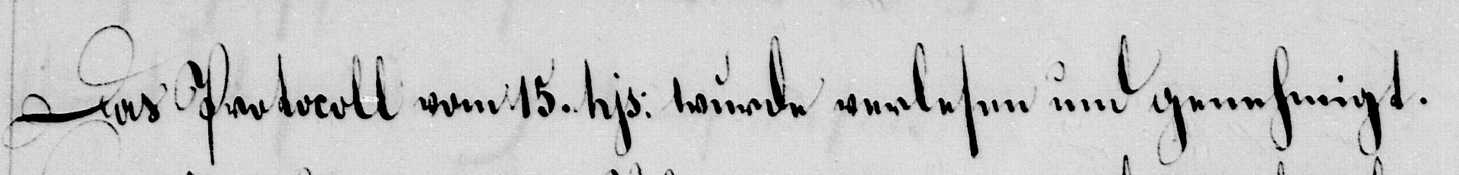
Das Protokoll vom 15. hjs. wurde verlesen und genehmigt.
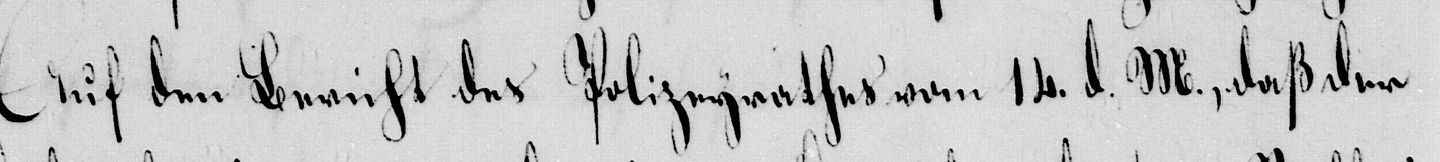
Auf den Bericht des Polizeyrathes vom 14. d. M., daß der
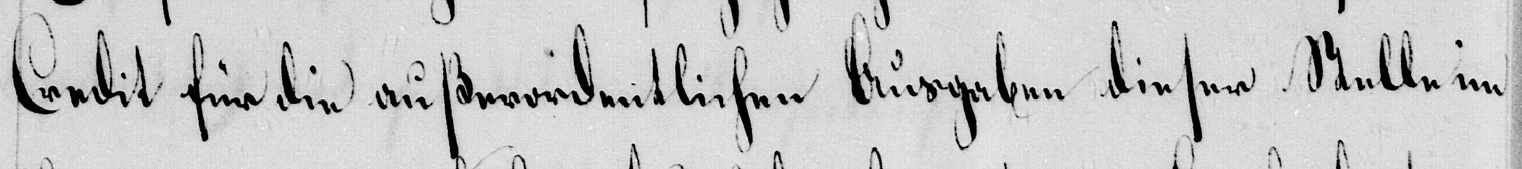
Credit für die außerordentlichen Ausgaben dieser Stelle im
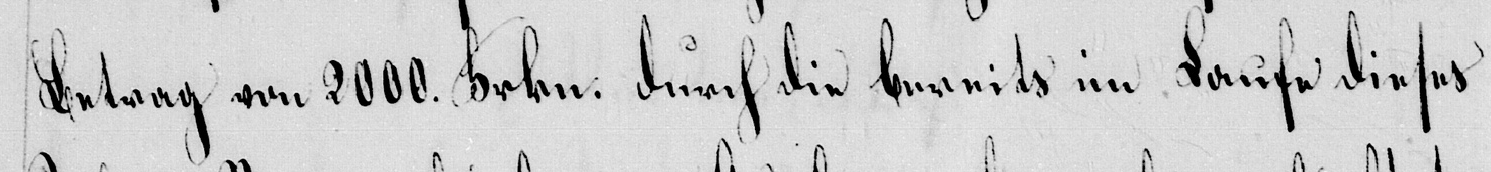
Betrag von 2000. Frkn. durch die bereits im Laufe dieses
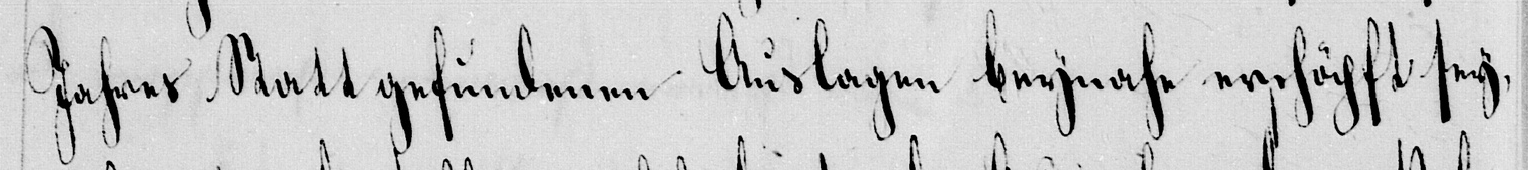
Jahres Statt gefundenen Auslagen beynahe erschöpft sey,
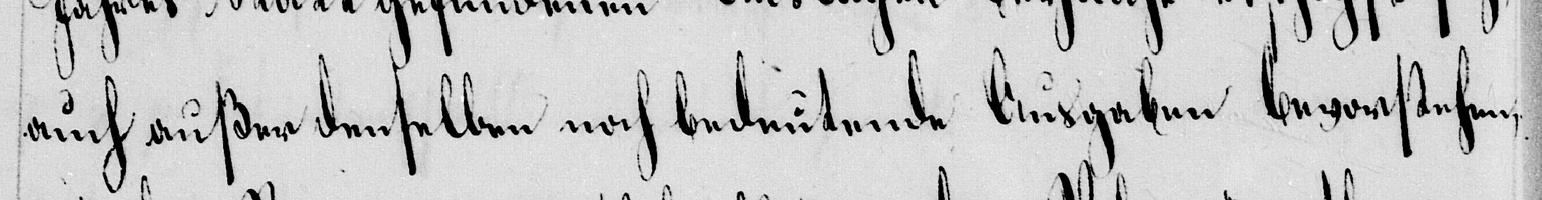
auch außer denselben noch bedeutende Ausgaben bevorstehen,
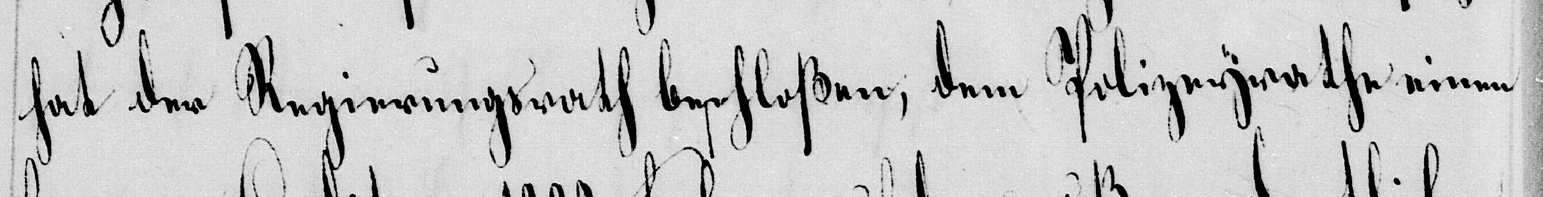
hat der Regierungsrath beschloßen, dem Polizeyrathe einen
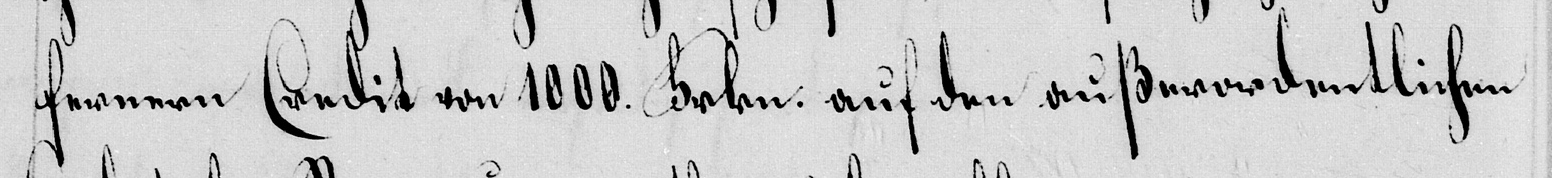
fernern Credit von 1000. Frkn. auf den außerordentlichen
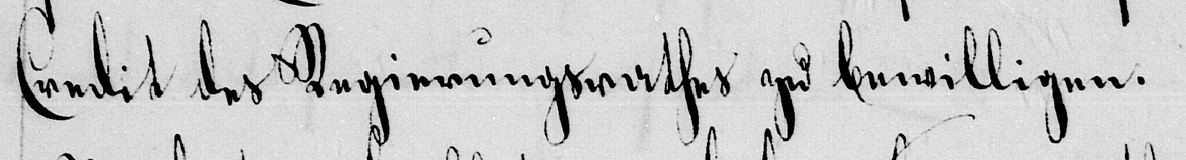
Credit des Regierungsrathes zu bewilligen.
